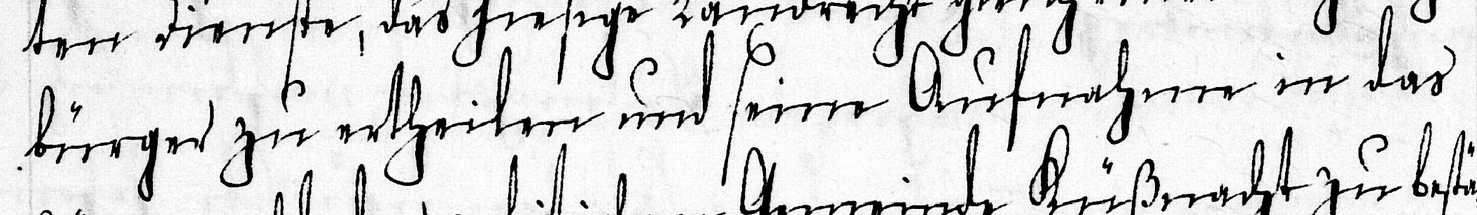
bürger zu ertheilen und seine Aufnahme in das
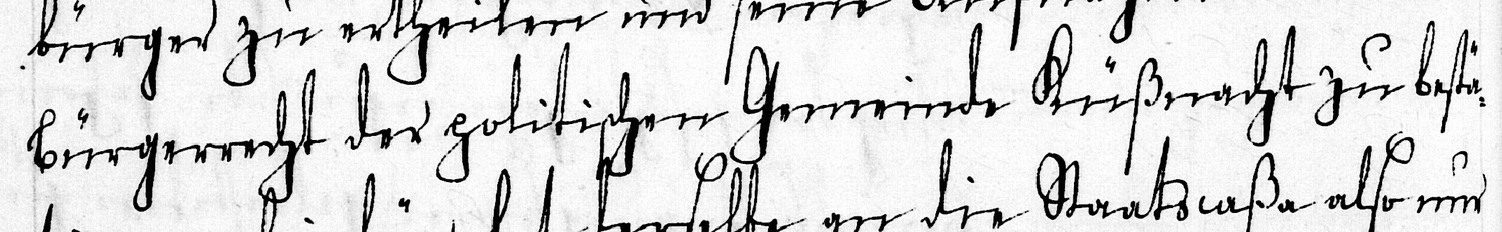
Bürgerrecht der politischen Gemeinde Küßnacht zu best¬
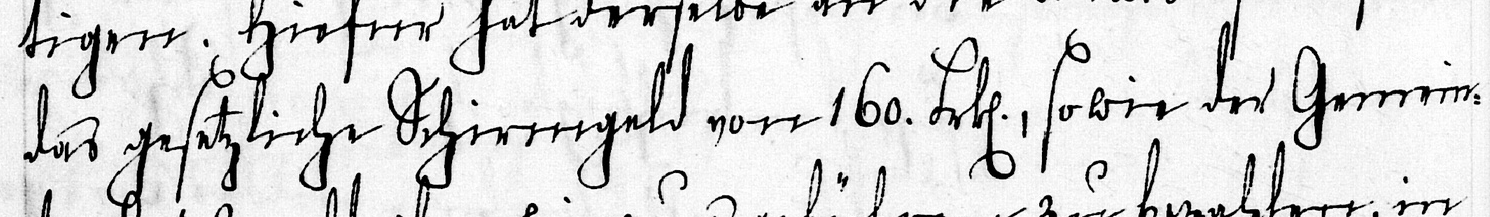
das gesetzliche Schirmgeld von 160. Frk[en]., sowie der Gemei¬
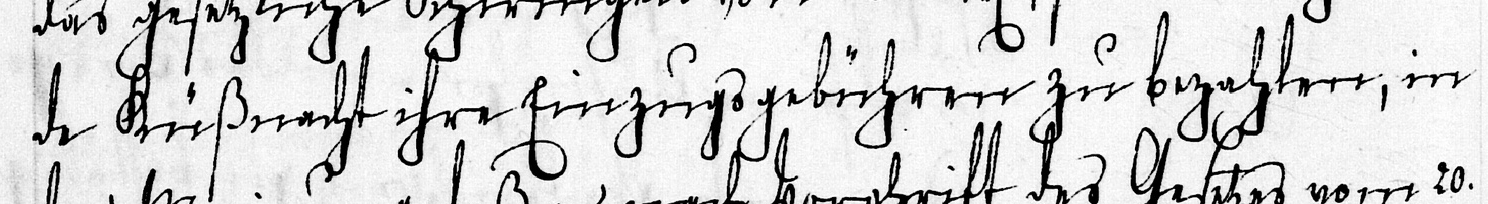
nde Küßnacht ihre Einzugsgebühren zu bezahlen, in
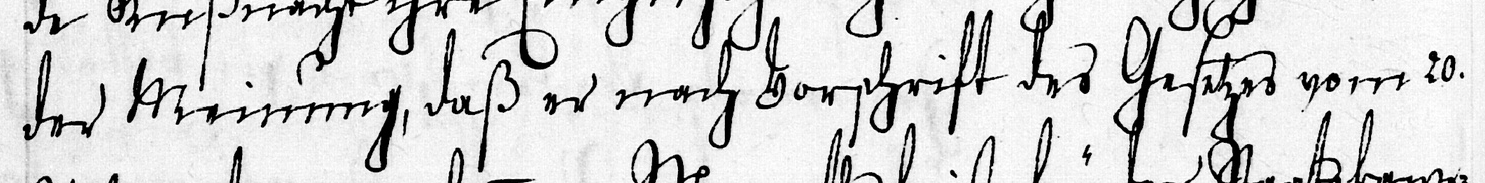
der Meinung, daß er nach Vorschrift des Gesetzes vom 20.
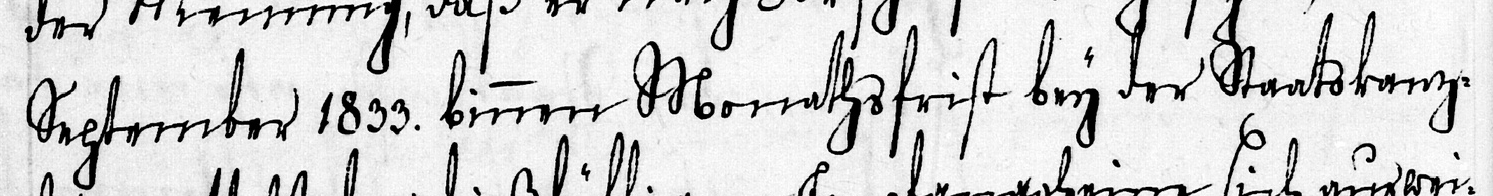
September 1833. binnen Monathsfrist bey der Staatskanz¬
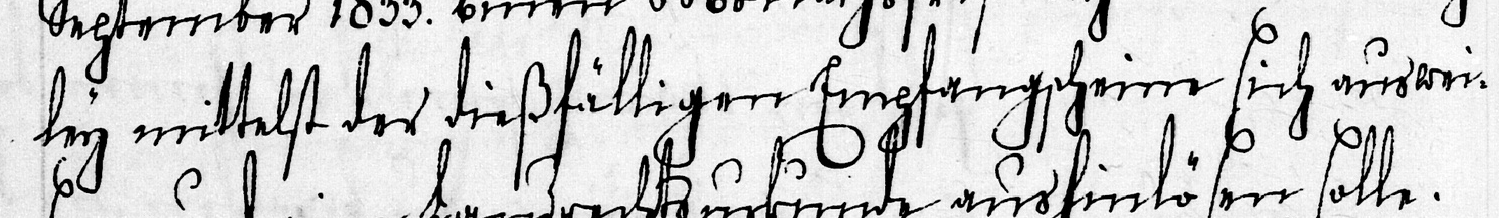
ley mittelst der dießfälligen Empfangscheine sich auswei¬
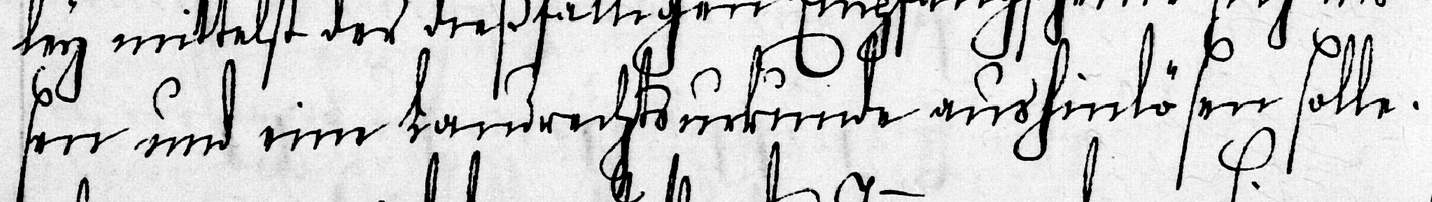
sen und eine Landrechtsurkunde aushinlösen solle.
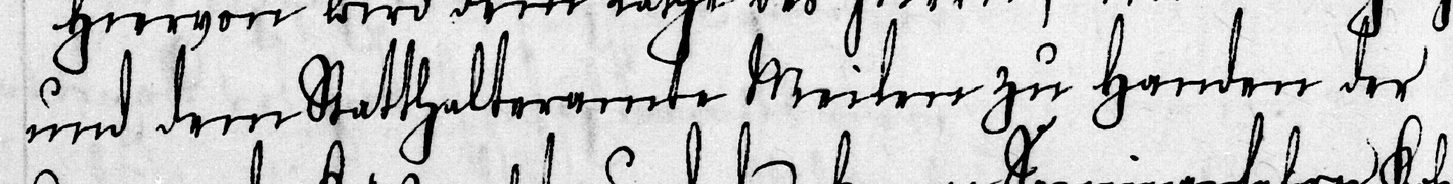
und dem Statthalteramte Meilen zu Handen der
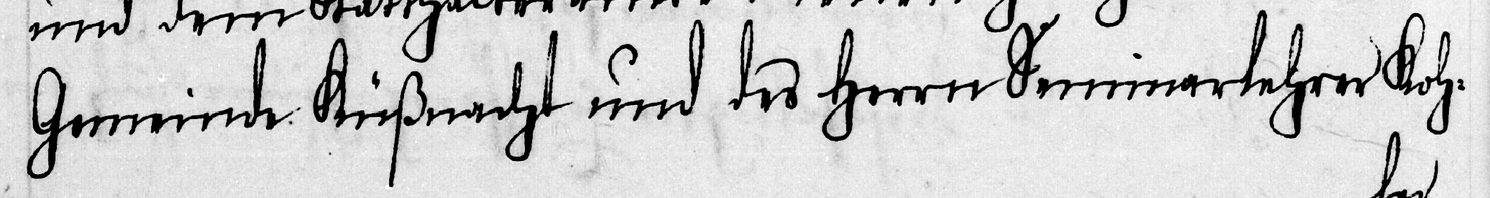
Gemeinde Küßnacht und des Herrn Seminarlehrer Koh-
